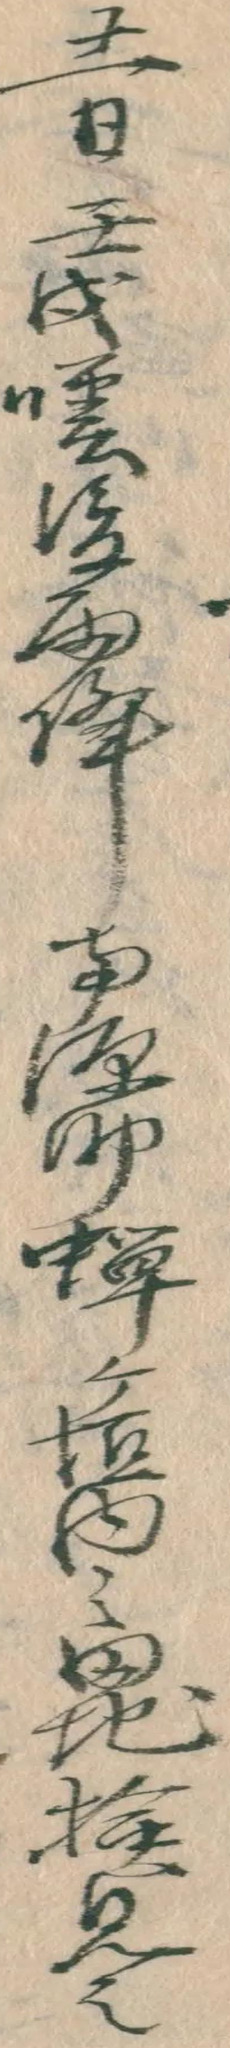十一日壬戌曇後雨降南源助蝉ケ垣内之田地検見之
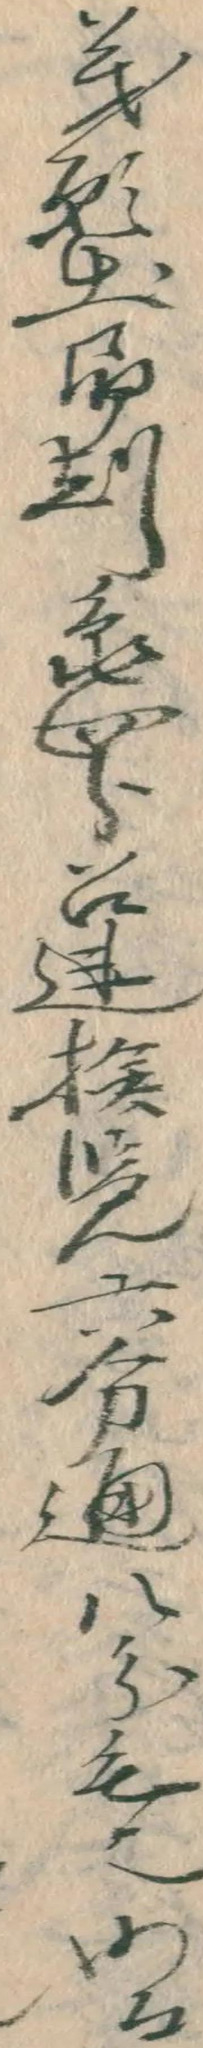義願出即刻亀四郎召連検覧六分通八分毛也仍而
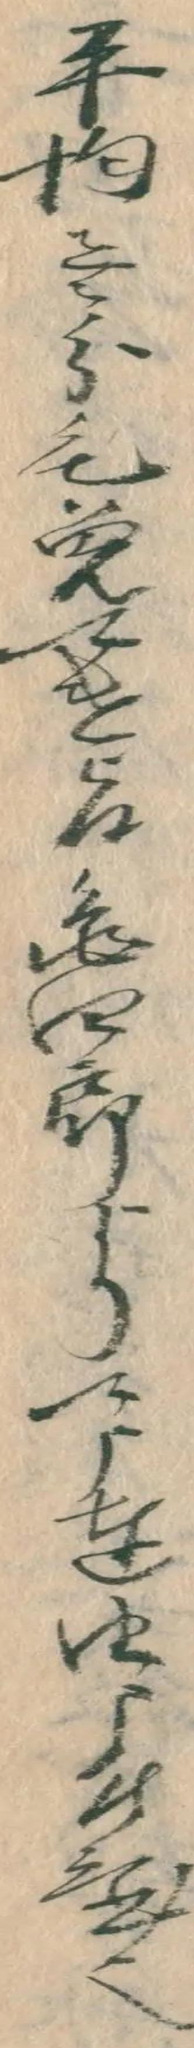平均壱分毛免可遣旨亀四郎より可申達由申付置也

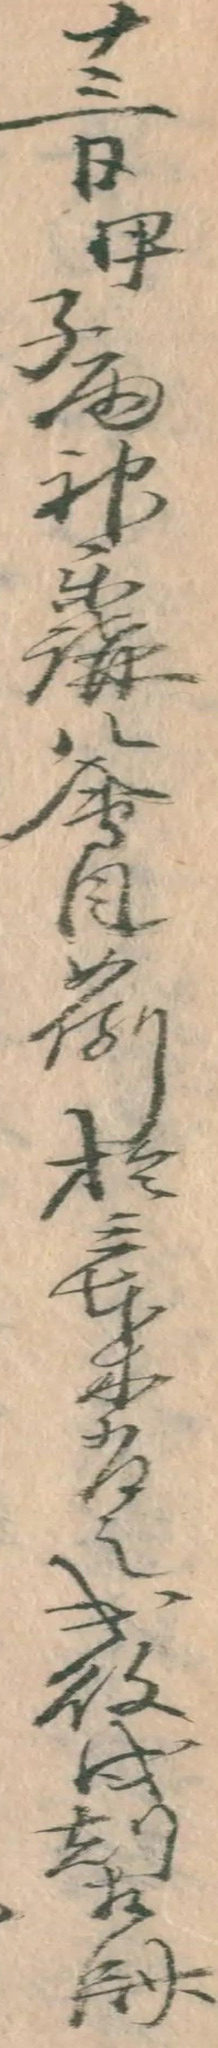十三日甲寅雨神楽講八會目如例於三本木有之出役戌刻相済
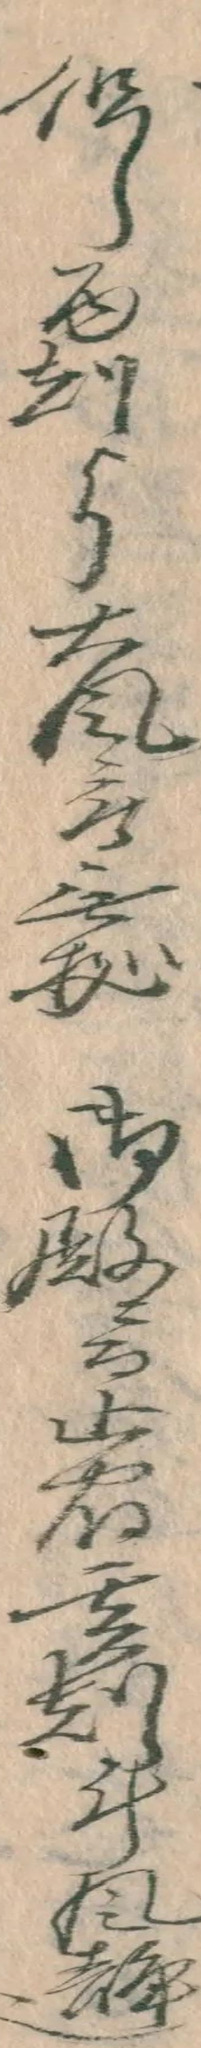但し酉刻より大風ニ付無拠御殿ニ而止宿亥刻斗風静也
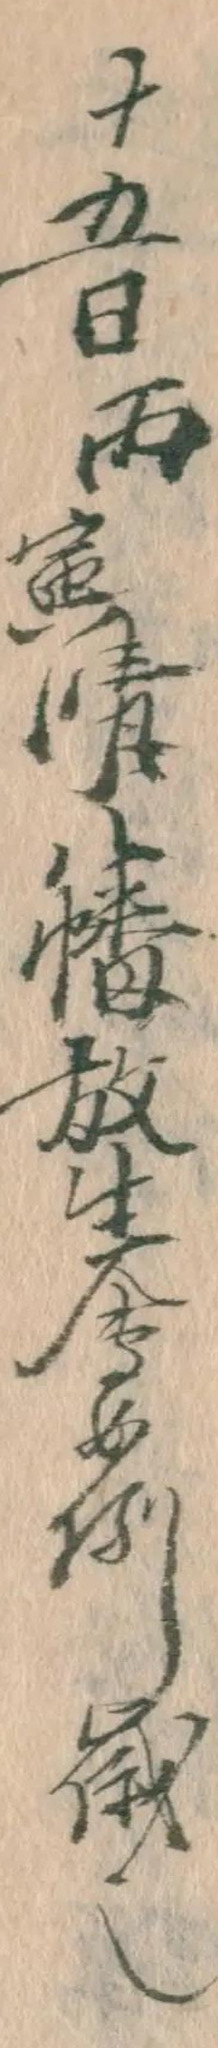十五日丙寅晴八幡放生會如例歳也
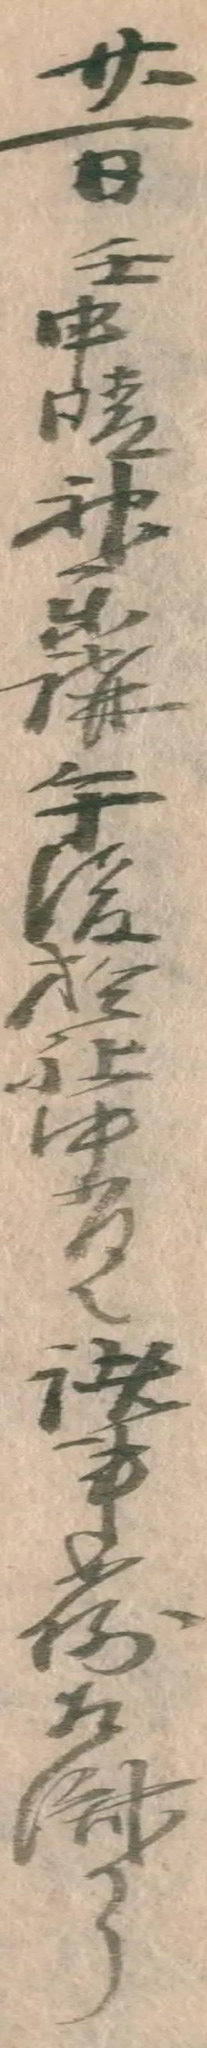廿一日壬申晴神楽講午後於社中有之諸事如例相済了
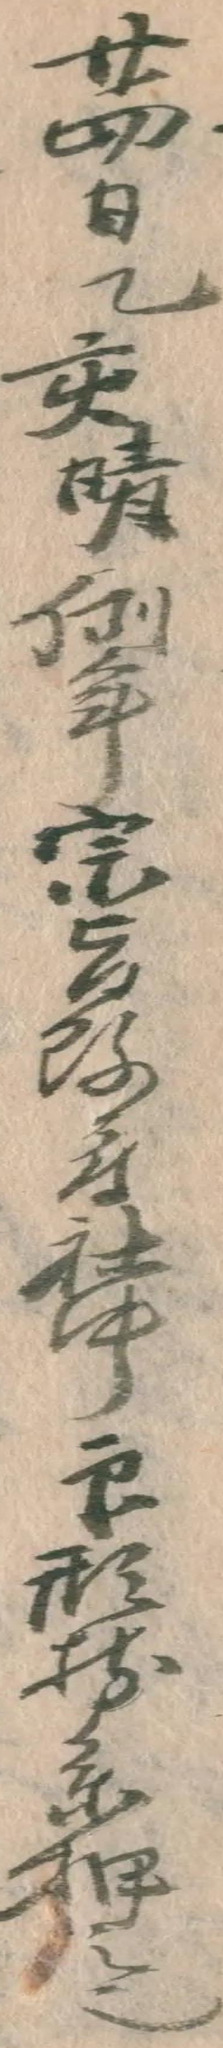廿四日乙亥晴例年宗旨改ニ付社中印形持参押之也
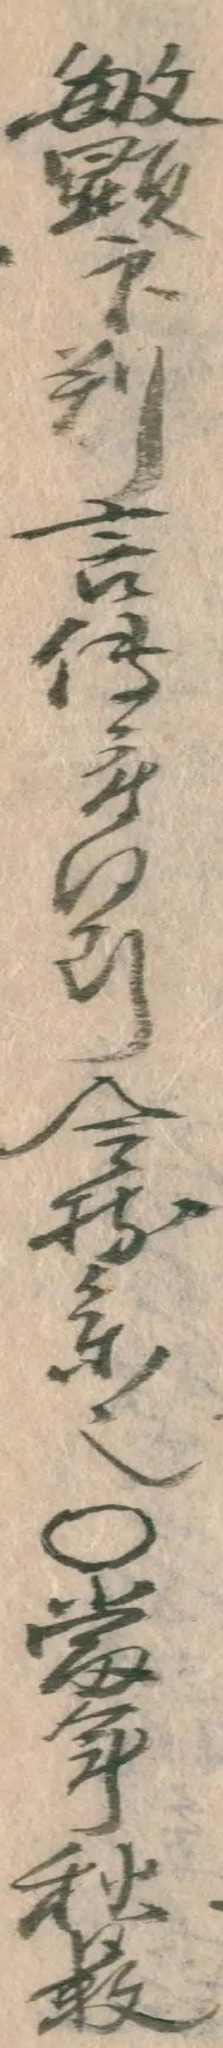敏顕印判言傳ニ付同断令持参也○當年秋日数
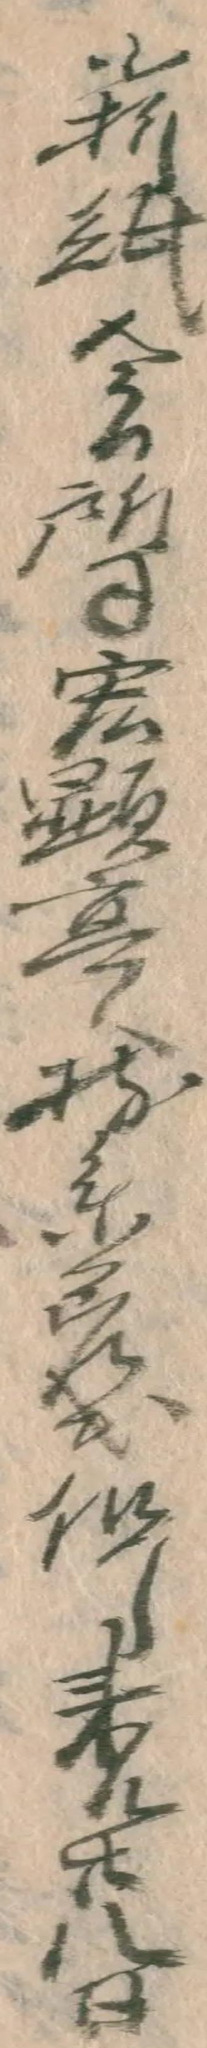小折紙今日所司宏顕亭へ持参差出但し来ル廿八日
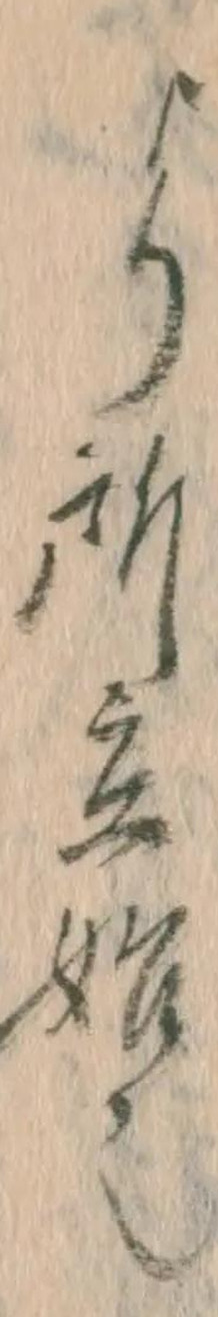より所立始也
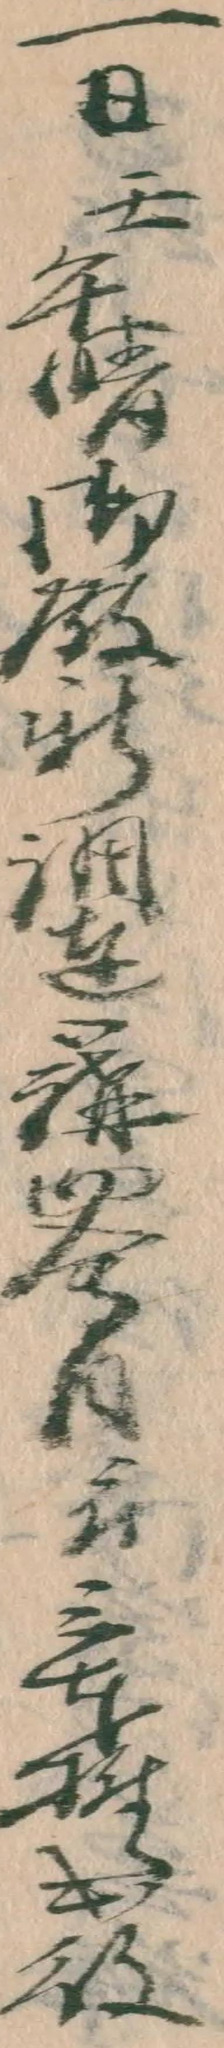二日壬午晴御殿新調達御構四會目ニ付三本樹出役
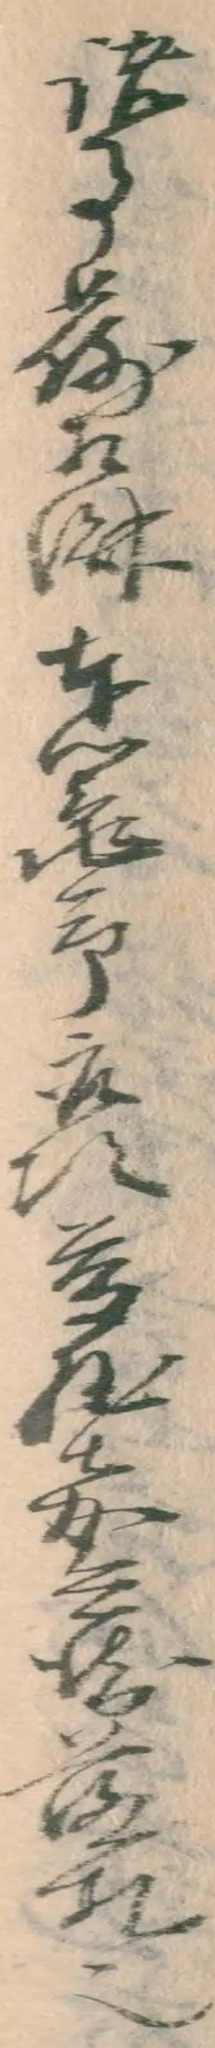諸事如例相済本鬮予取次蔵屋敷嘉兵衛落札也
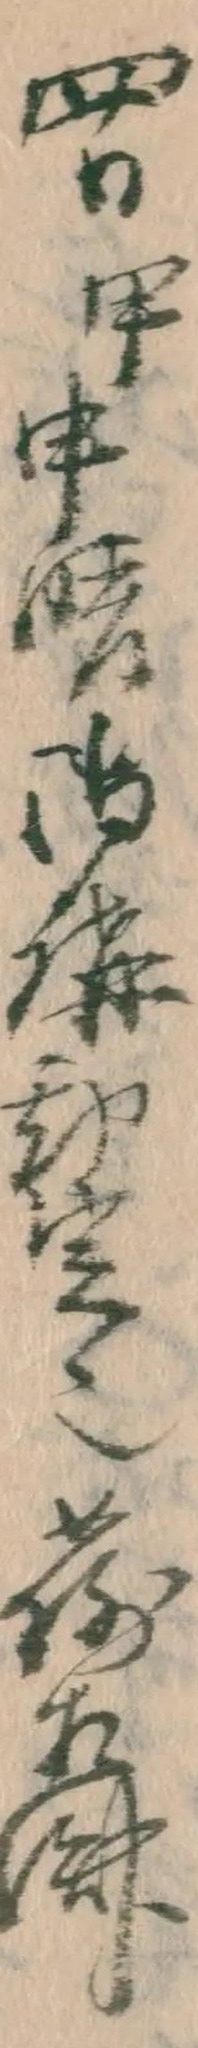四日甲申晴御講勘定也如例相済
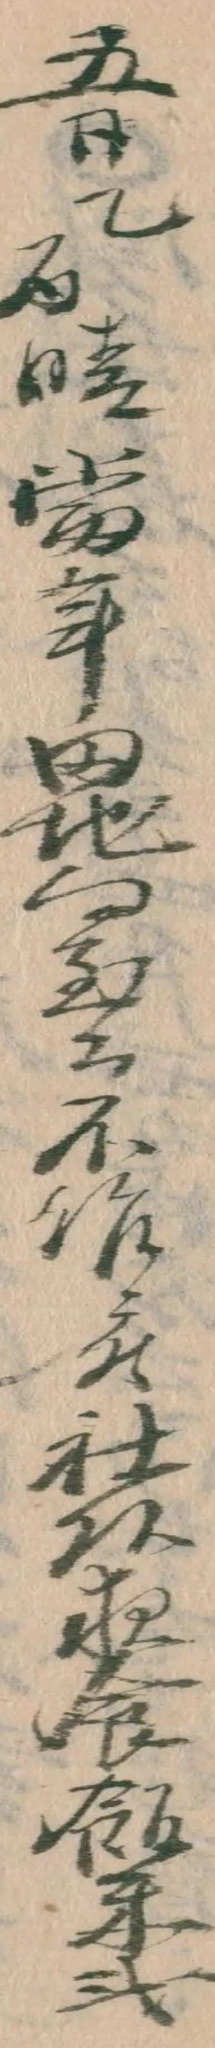五日乙酉晴當年田地向至而不作ニ付社頭夜食飯米弐
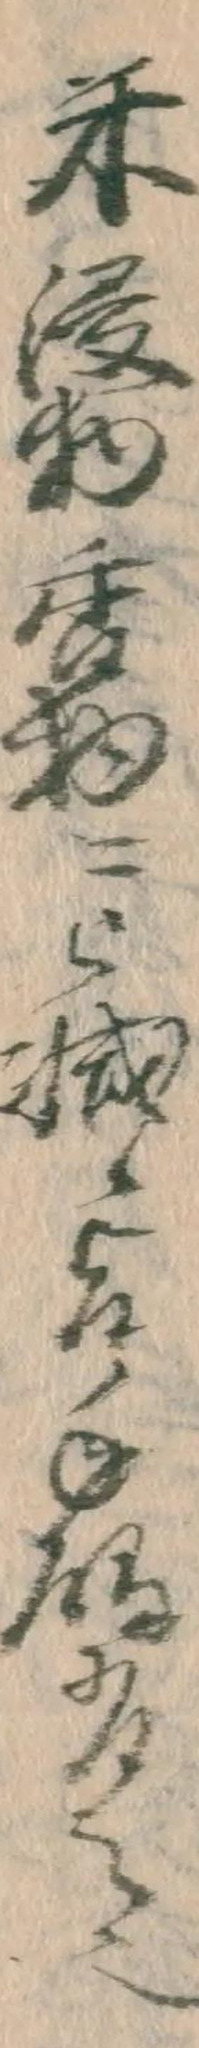米浸物香物ニ被減候旨手觸有之也
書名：賀茂社記録. 第67冊
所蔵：国立国会図書館 National Diet Library, JAPAN
